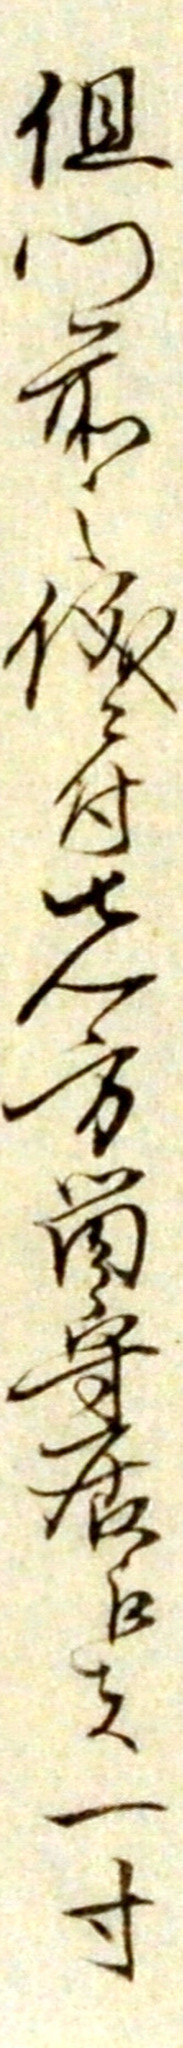但門前之儀ニ付先方留守居えは一寸
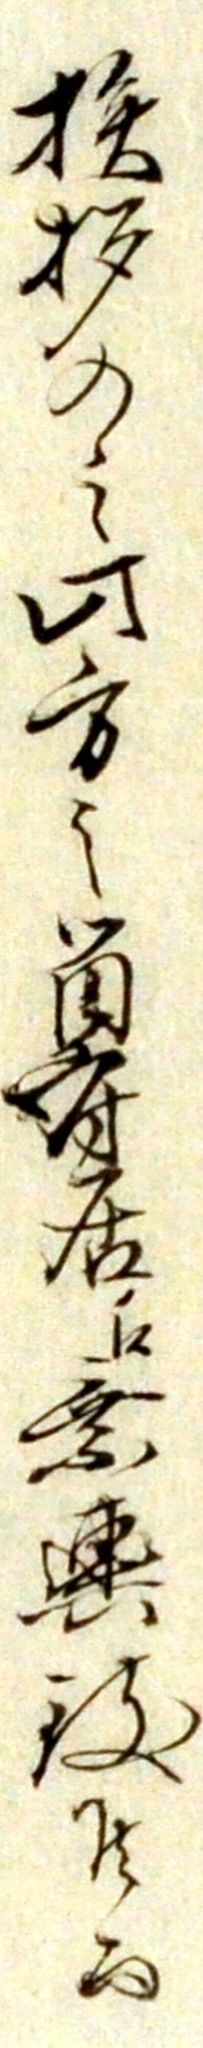挨拶のミ此方之留守居え乗輿致候而
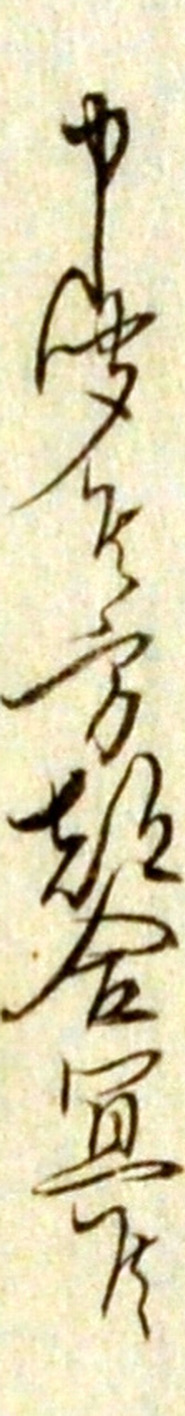申聞候方都合宜候
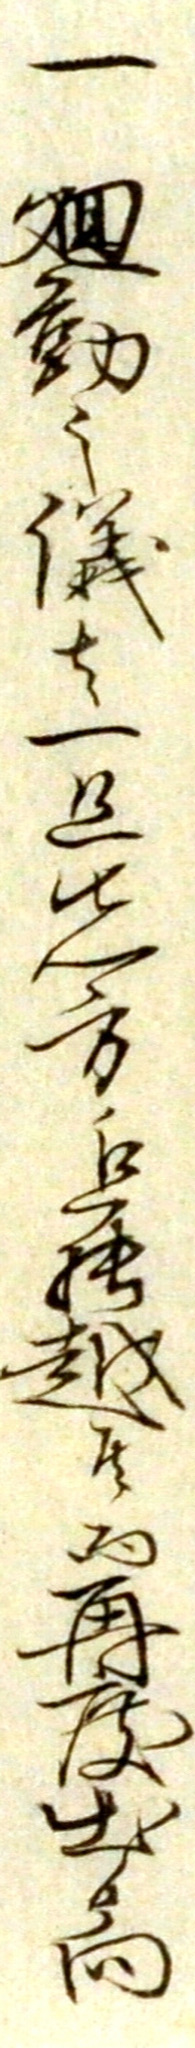一廻勤之儀は一旦先方え罷越候而再度出候向
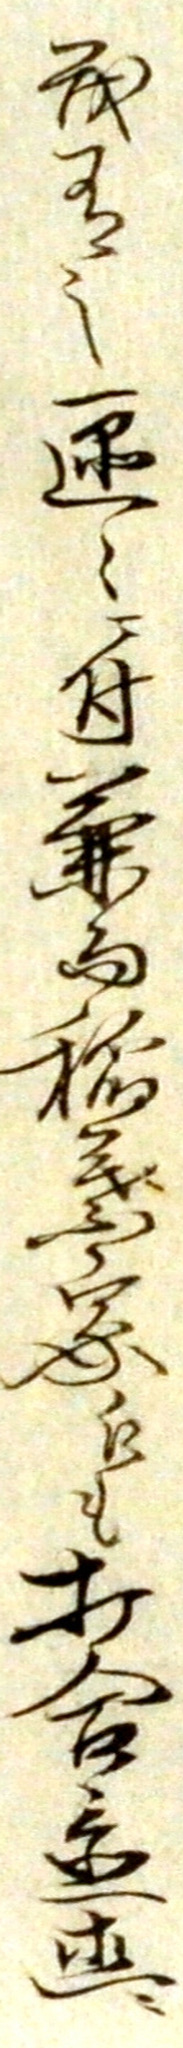も有之区々ニ付兼而稲葉家えも打合置直ニ
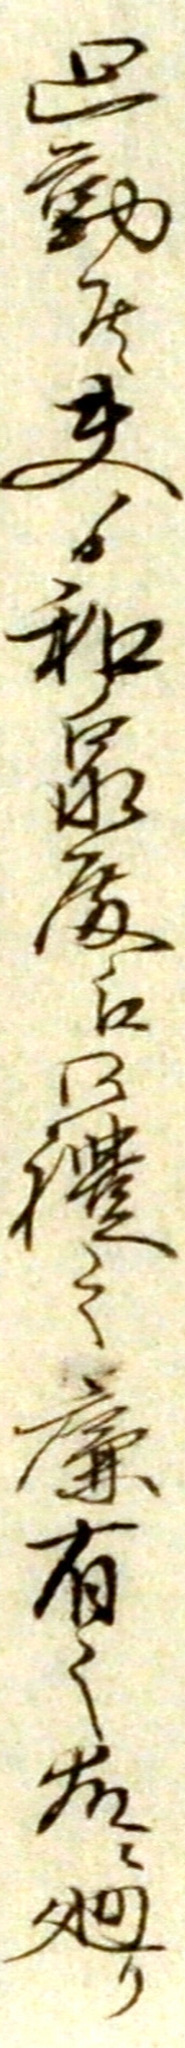廻勤候夫ゟ和泉殿え御礼之廉有之故ニ廻り
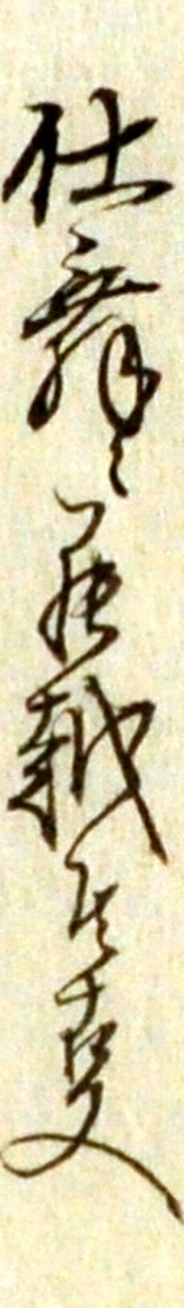仕舞ニ罷越候事
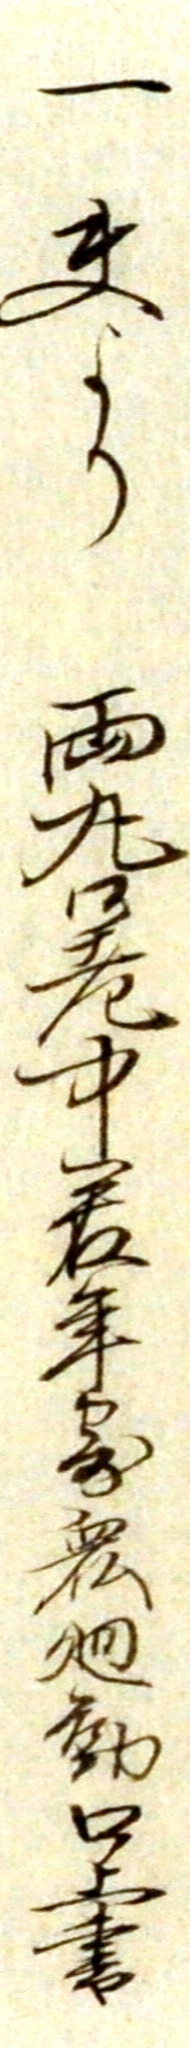一夫より西丸御老中若年寄衆廻勤口上書
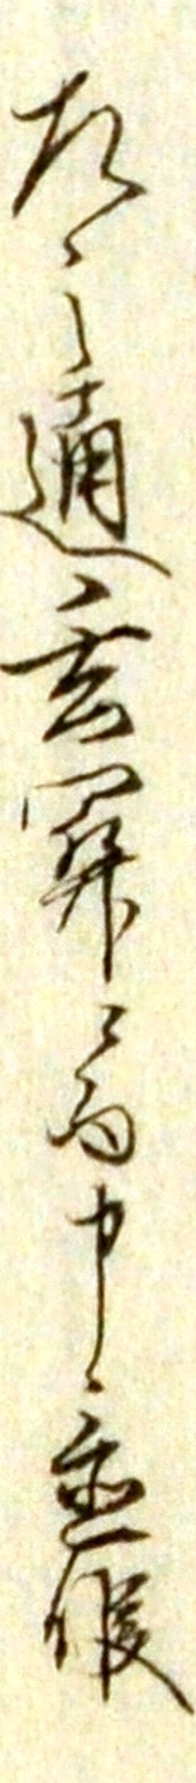左之通玄関ニ而申置候
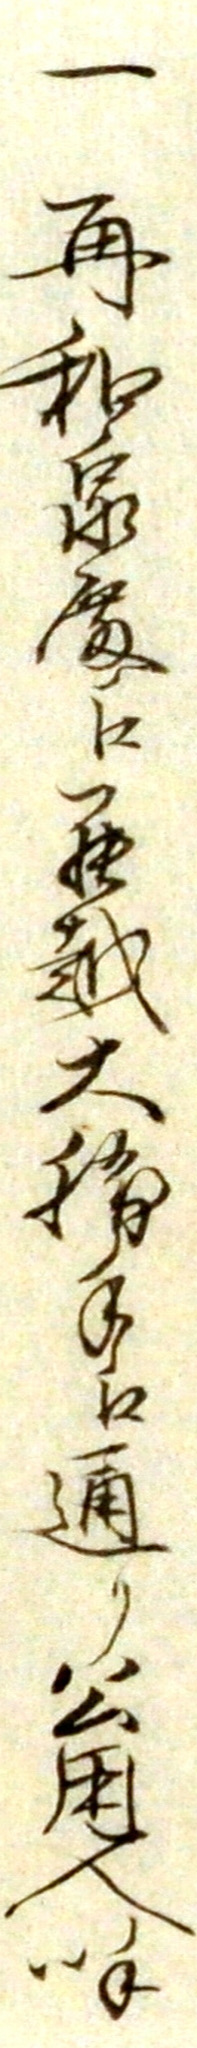一再和泉殿え罷越大勝手え通り公用人呼
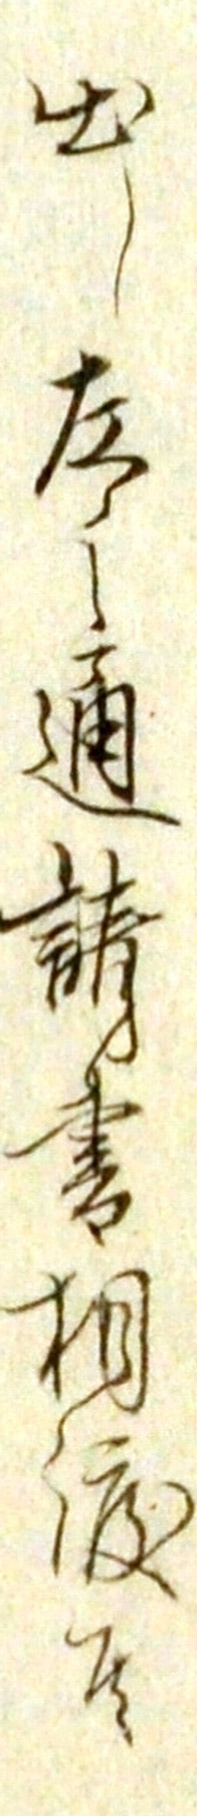出し左之通請書相渡候

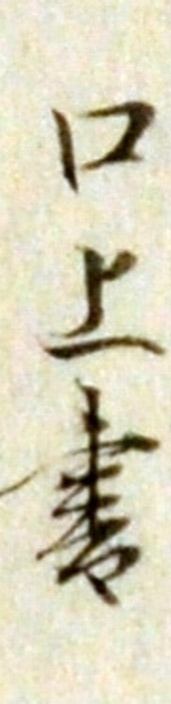口上書
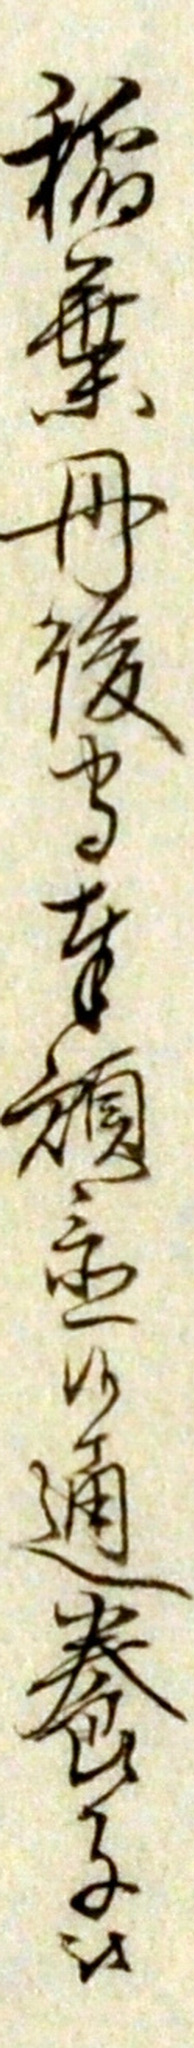稲葉丹後守奉願置候通養子被
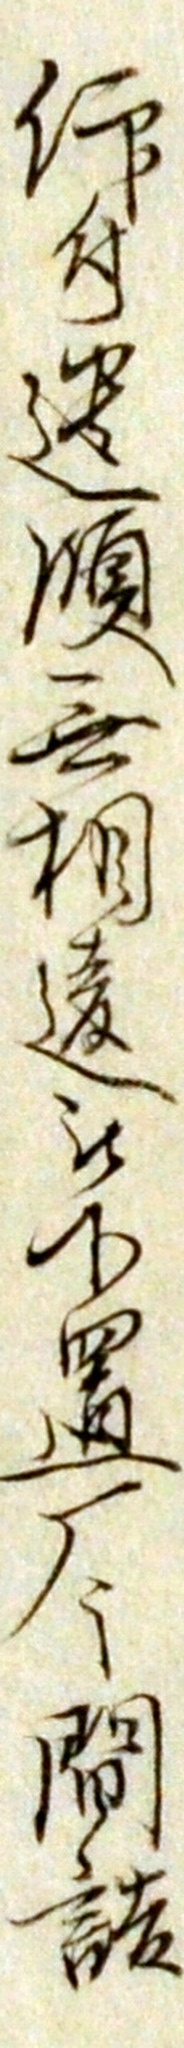仰付遺領無相違被下置雁之間詰
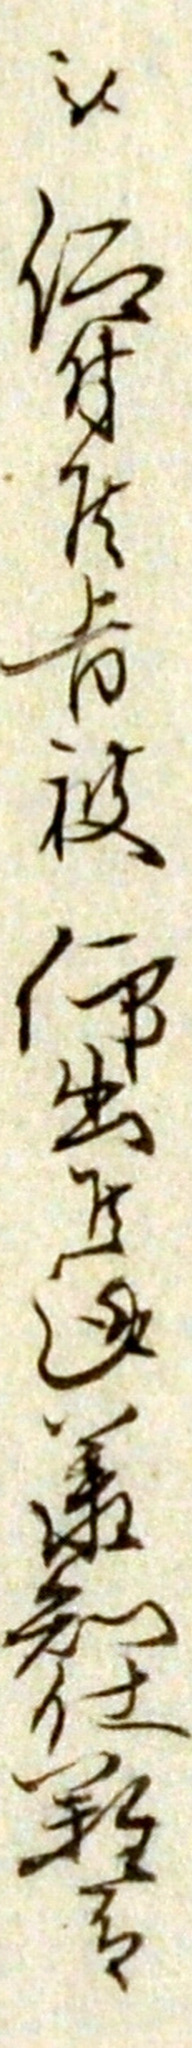被仰付候旨被仰出候趣承知仕難有
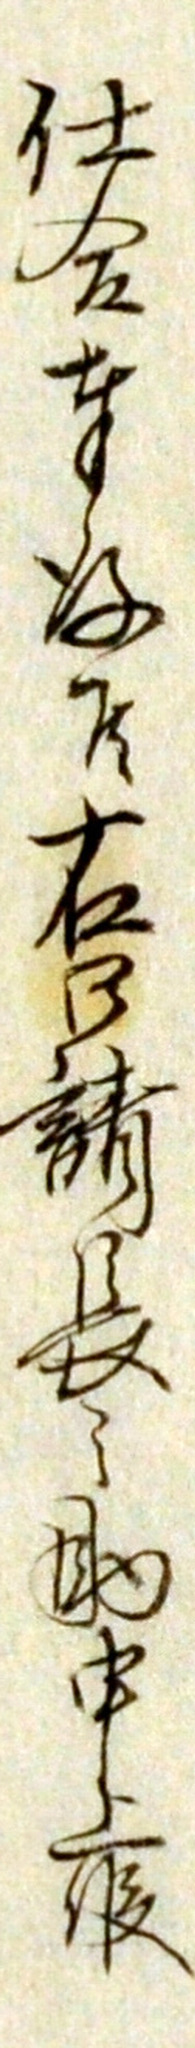仕合奉存候右御請長之助申上候
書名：諸名代相勤候節ノ留書外
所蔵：伊那市立高遠町図書館・合同会社AMANE
